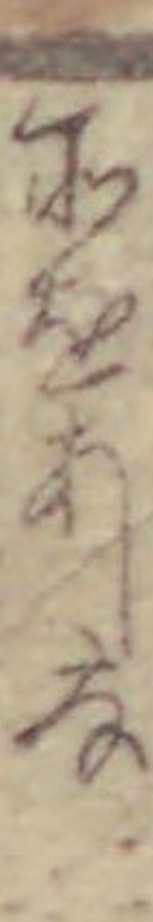所をあしな
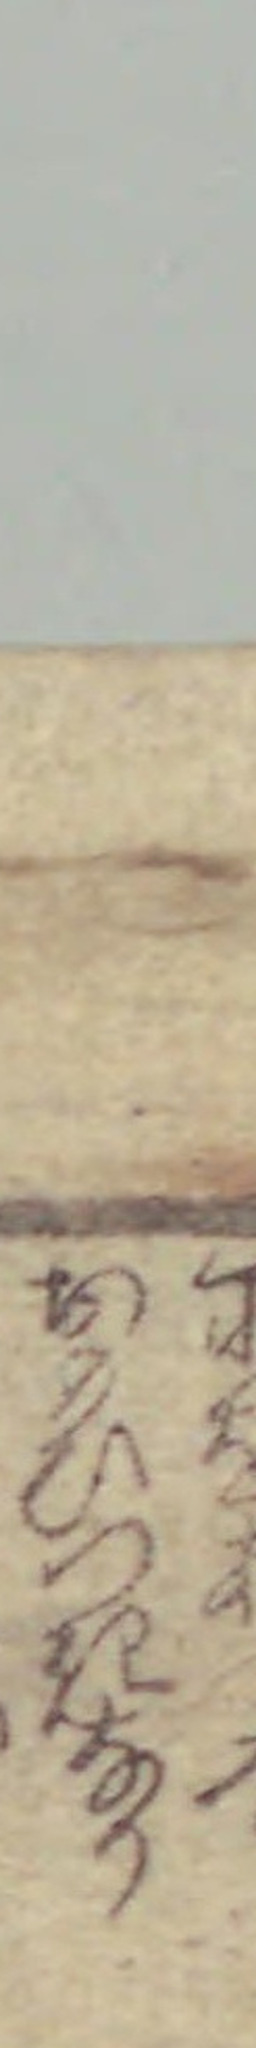おもひつきなり
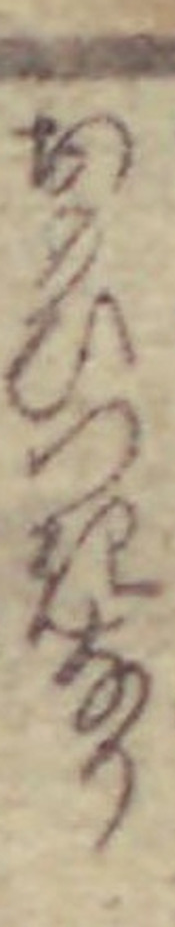おもひつきなり
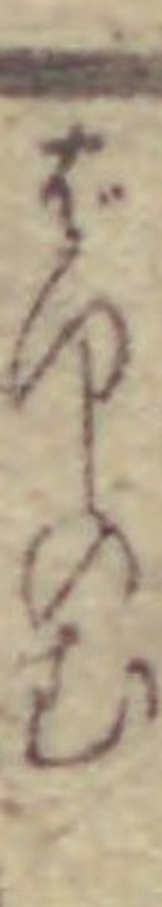ばつしのむ
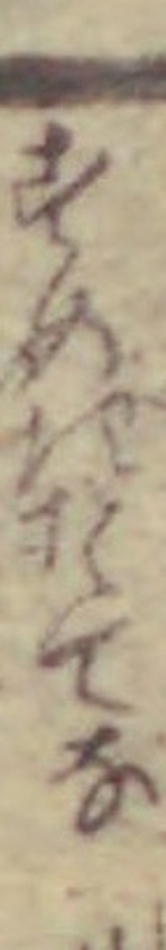すめきたてな
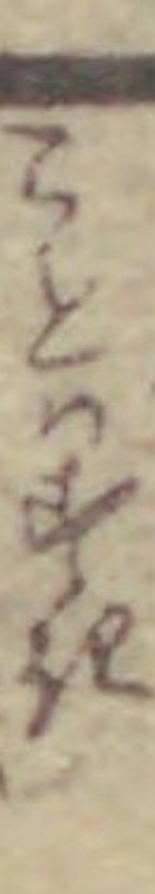ことかすき
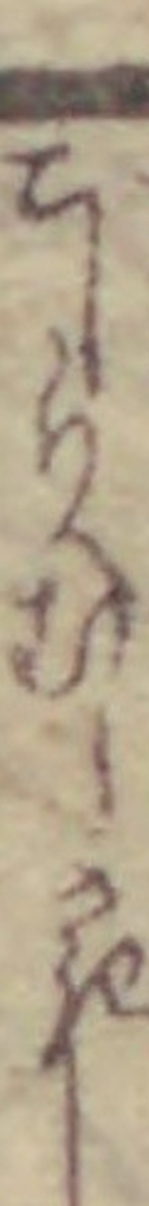こしらへむらさき
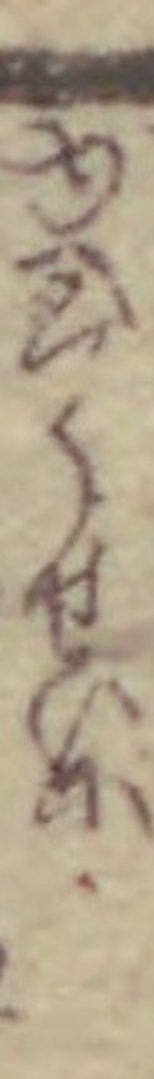ゆへとうせいに
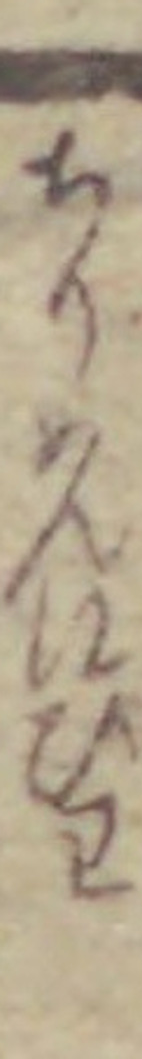ちりめんにひわ
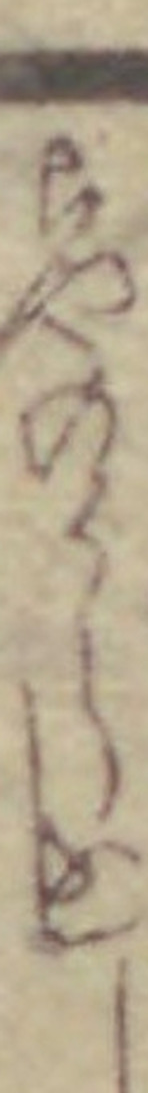ちやのうらふし
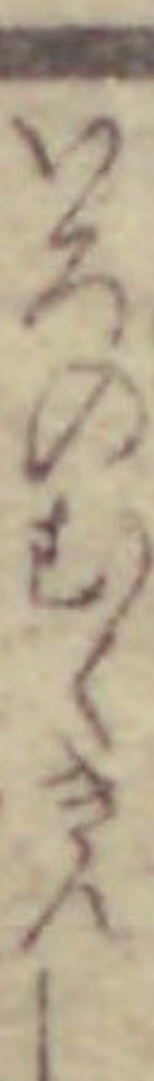いろのむくきん
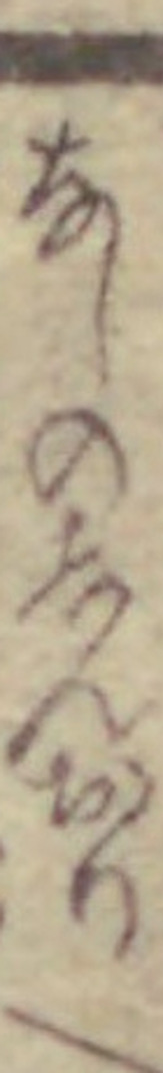なしのしんおり
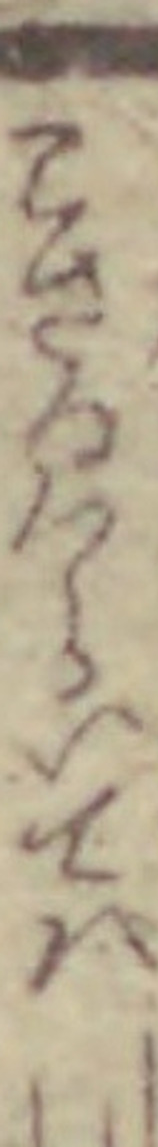こさるくらいては
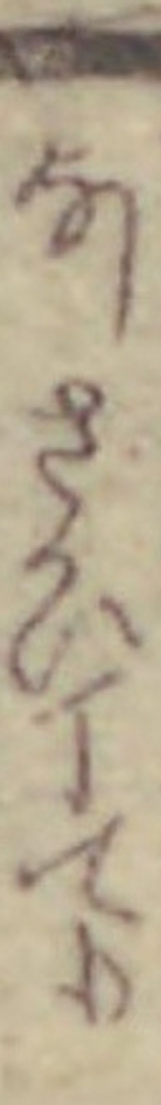なしさかひ丁ても
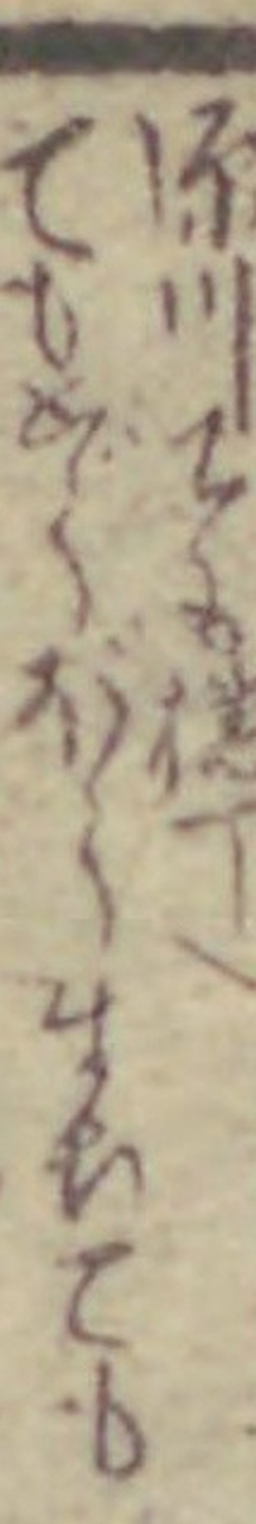てもどうぼうまちても
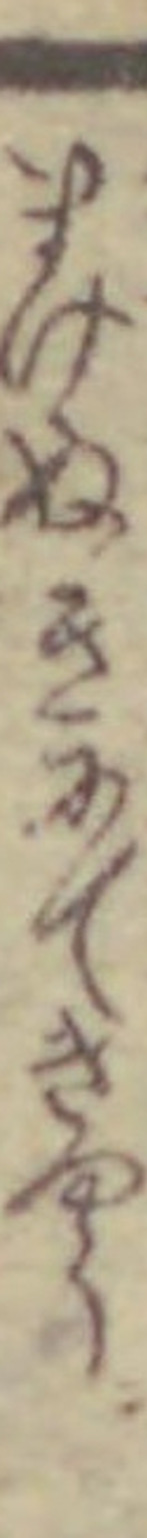まけぬきにてきやう
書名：思事夢濃枕 3巻
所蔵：国立国会図書館 National Diet Library, JAPAN
